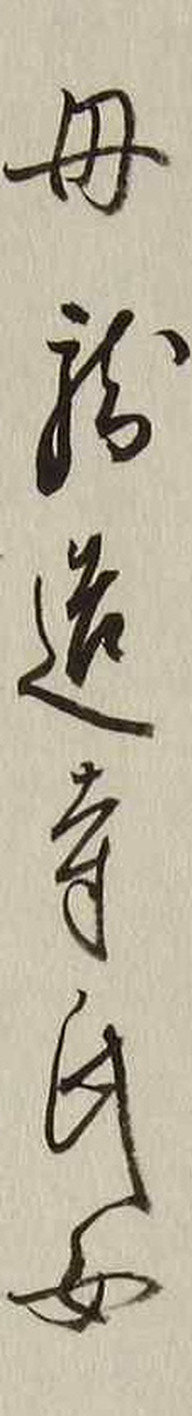母龍造寺氏
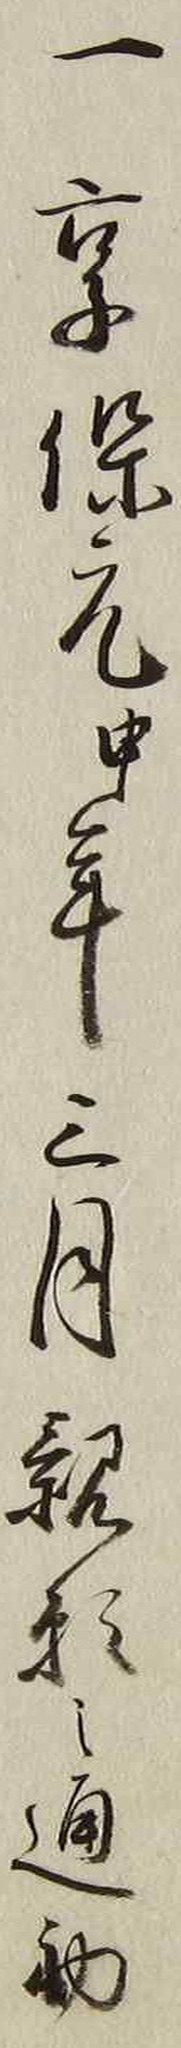一享保元申年三月親願之通初
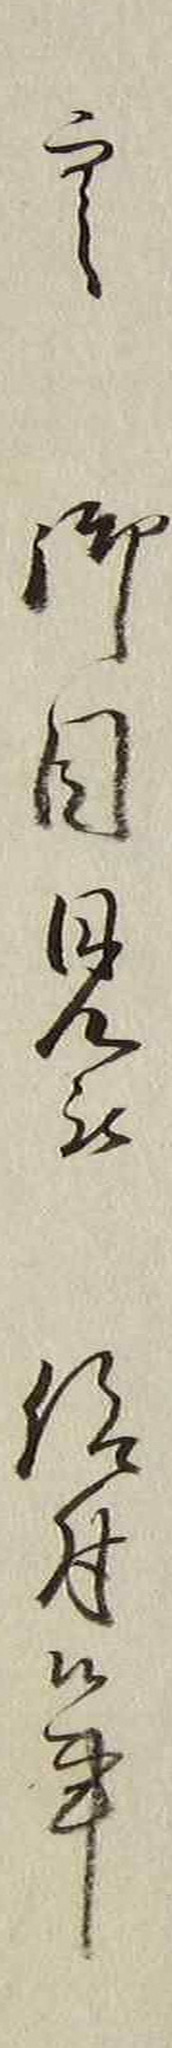而之御目見被仰付候事
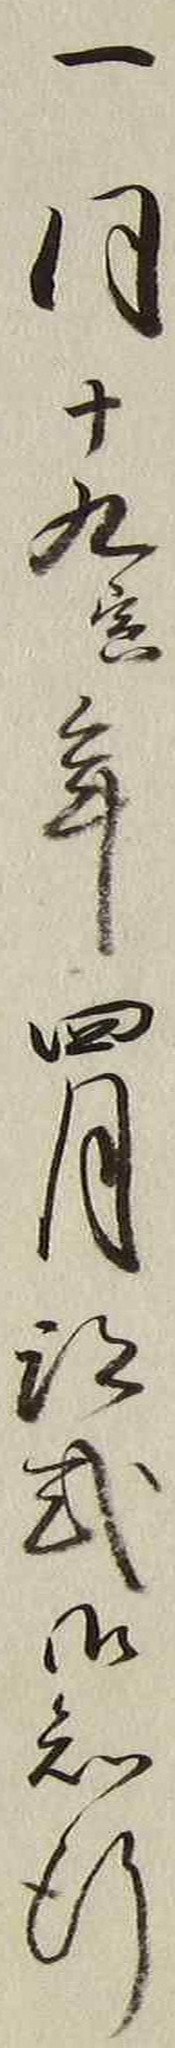一同十九寅年四月跡式御知行
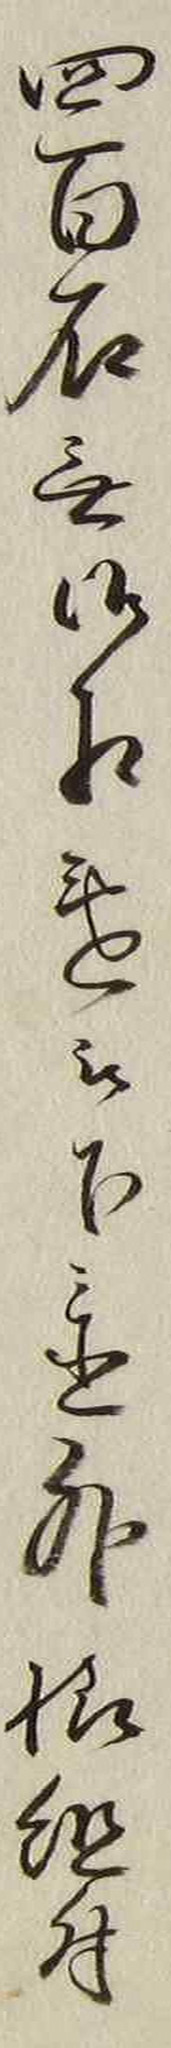四百石無御相違被下置外様組付
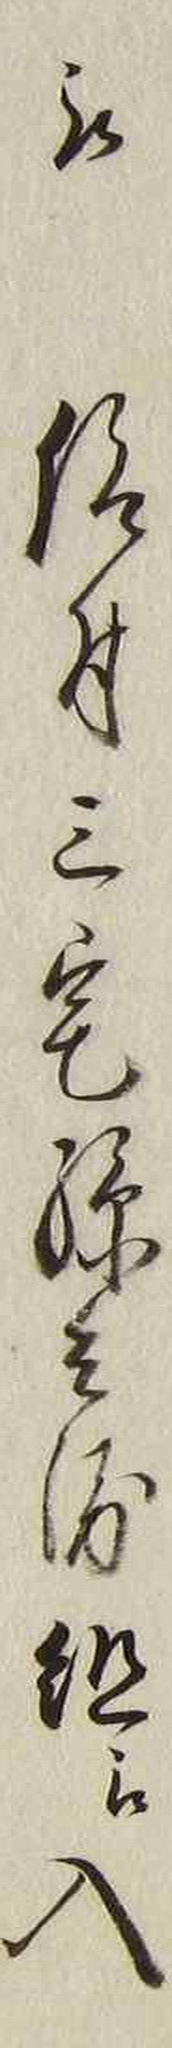被仰付三宅孫兵衛組江入
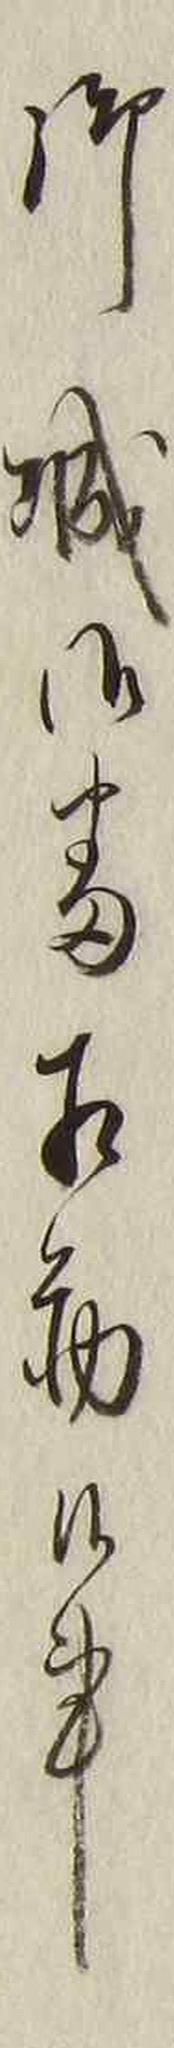御城御番相勤候事

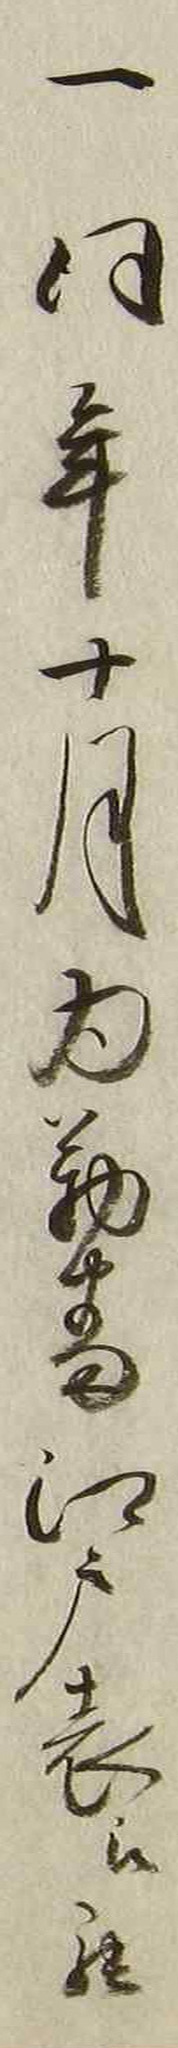一同年十月為勤番江戸表江罷
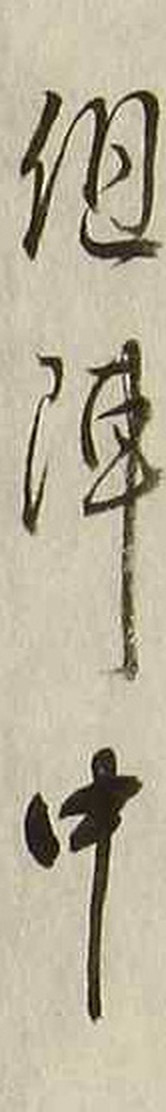但陣中
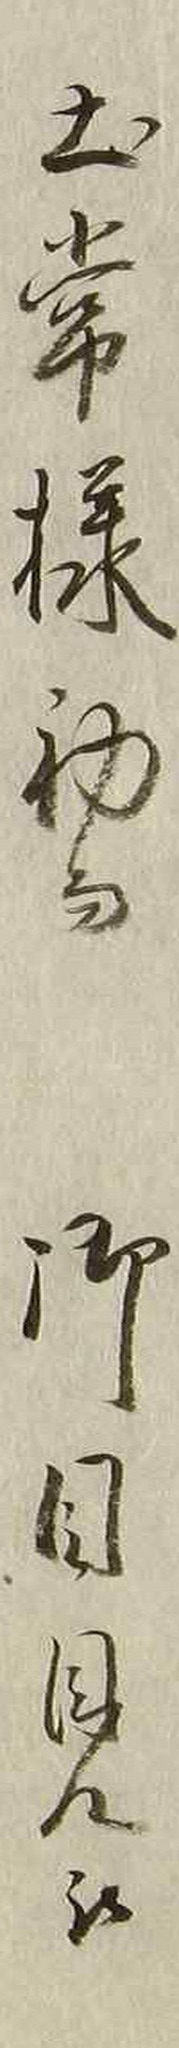土常様初而御目見被
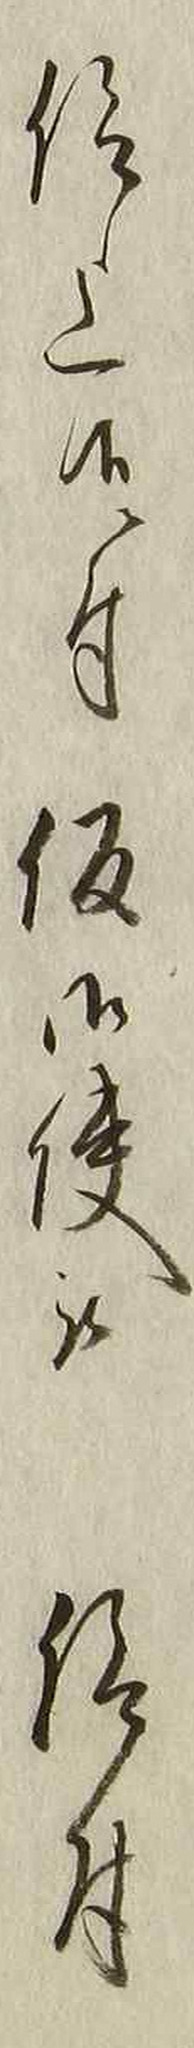仰上候ニ付仮御使被仰付
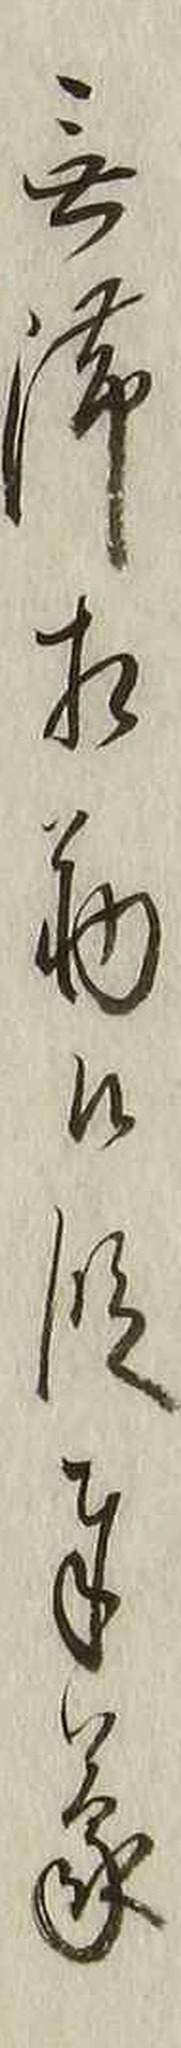無滞相勤候段奉蒙
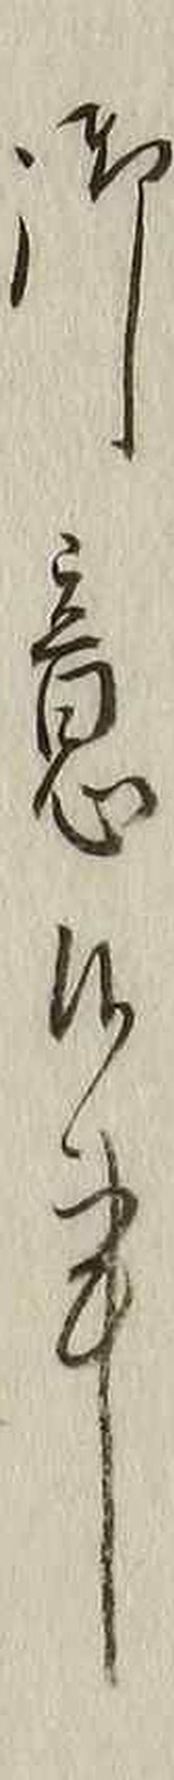御意候事
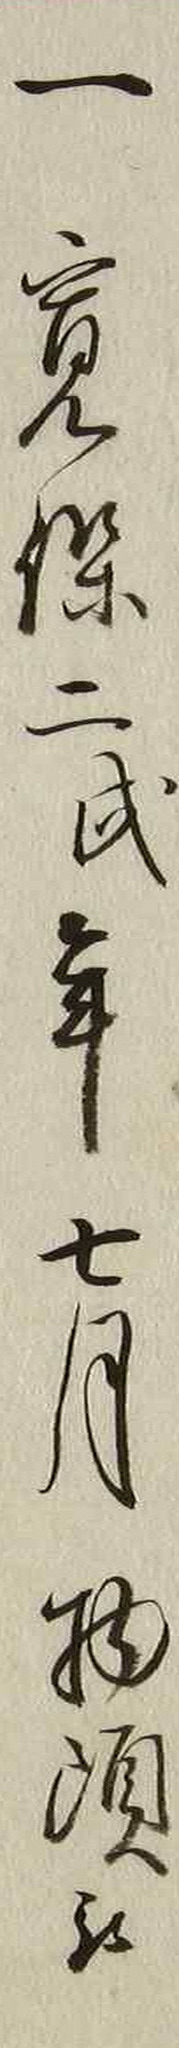一寛保二戌年七月物頭被
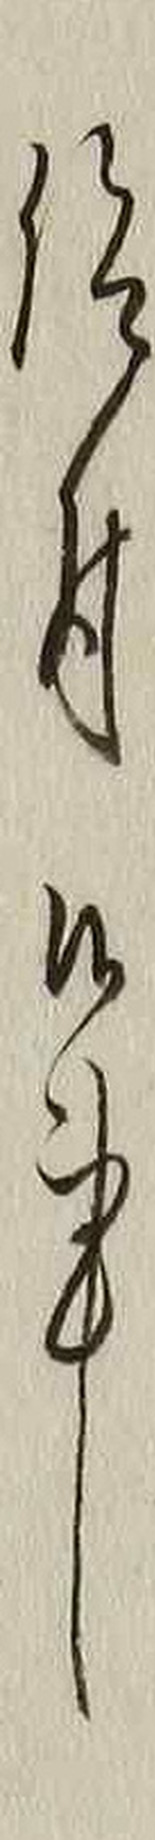仰付候事
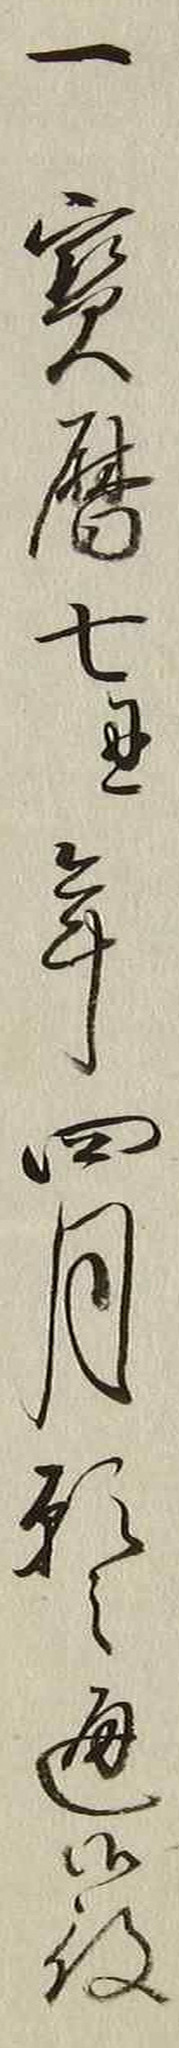一宝暦七丑年四月願之通御役
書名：諸士系譜　巻之18　い之部18
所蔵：会津若松市立会津図書館
